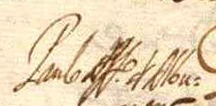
Paulo Aff.o d̄ Albu
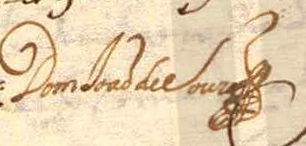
Dom Ioaõ de Souza
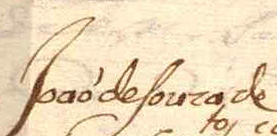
Joaõ de souza de
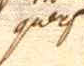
querq̄
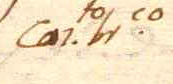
cas.to br.co
